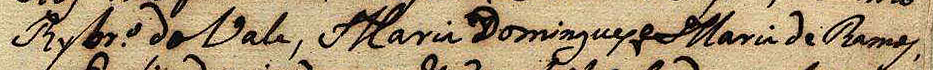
Rybr.o do Vale, Maria Domingues, e Maria de Ramos,
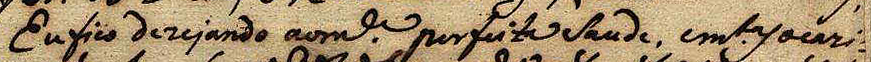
Eu fico dezejando a v m.e perfeita Saude, e m.tas ocazi
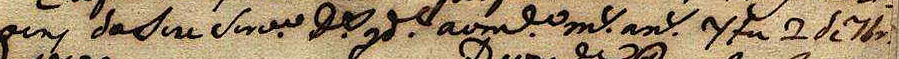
oens do Seu serv.o D.s gd.e a v m.e m.t an.s Ytu 2 de 7br.
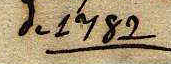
de 1782
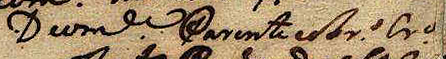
De v m.ce Parente e obr.o Cr.o
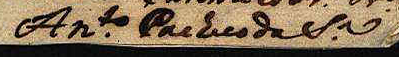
An.to Pacheco da S.a
